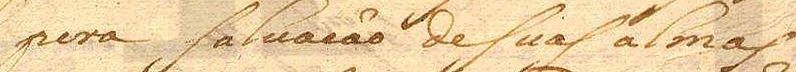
pera saluacaõ de suas almas
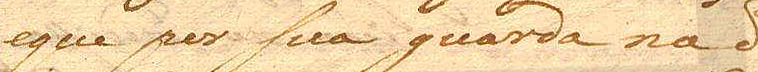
e que por sua guarda naõ
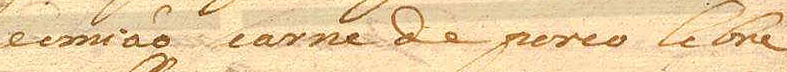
comiaõ carne de porco lebre
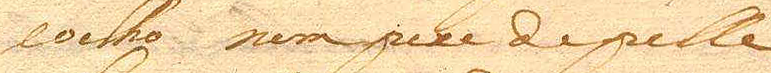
coelho nem pexe de pelle
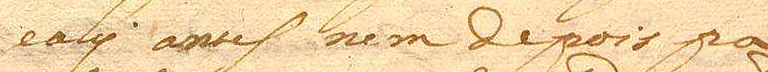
e aly antes nem depois pa
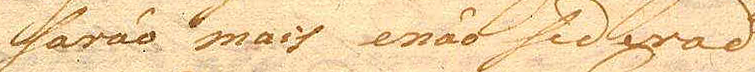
saraõ mais e naõ se deraõ
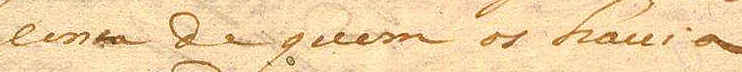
conta de quem os hauia
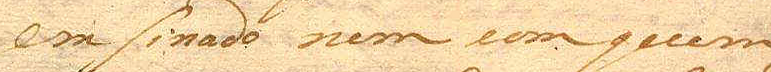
emsinado nem com quem
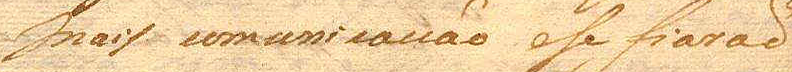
mais comunicauaõ e se fiaraõ
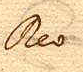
Reo
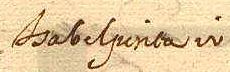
Isabel pinta ir
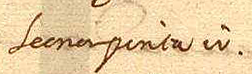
Leonor pinta ir.
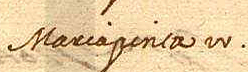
Maria pinta ir.
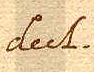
decl.
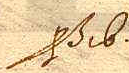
ꝓhib.
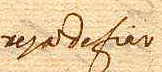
rezaõ de fiar
